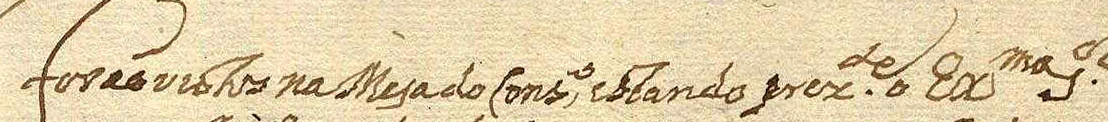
Foraõ vistos na Mesa do Cons.o estando prez.te o Ex.mo S.or
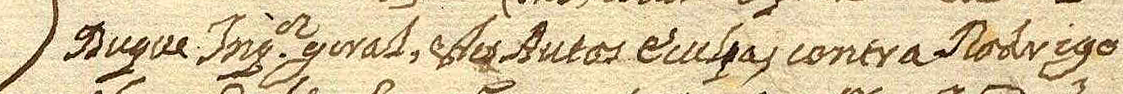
Duque Inq.or geral, estes Autos e culpas contra Rodrigo
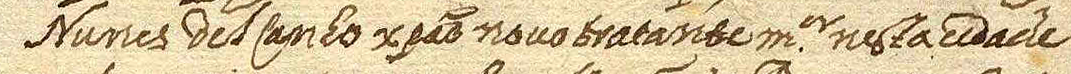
Nunes del Canho xpaõ nouo tratante m.or nesta cidade
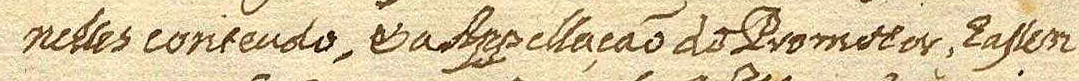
nelles conteudo, e a Appellaçaõ do Promotor, E assen
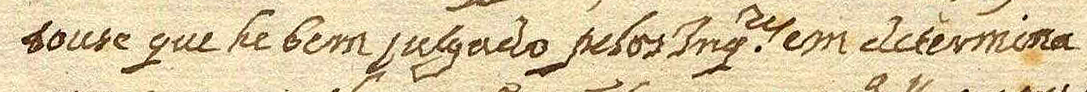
touse que he bem julgado pelos Inq.res em determina
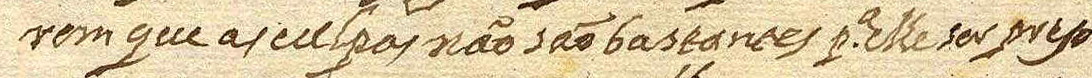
rem que as culpas naõ saõ bastantes p.a elle ser preso
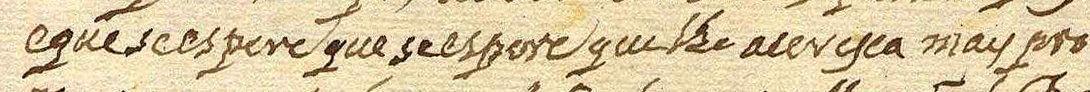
e que se espere que se espere que lhe accresca mais pro
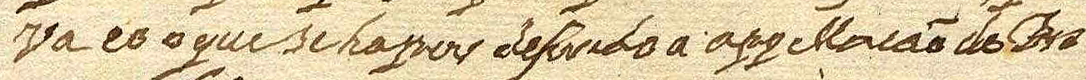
va co o que se ha por deferido a appellaçaõ do Pro
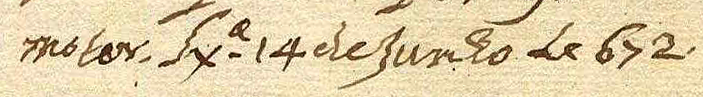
motor. Lxa 14 de Junho de 672.
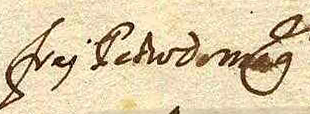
frej Pedro de mages
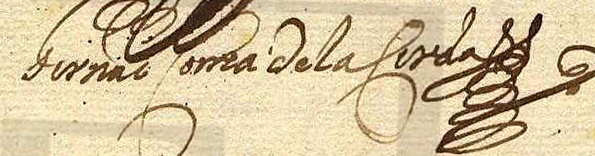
Fernaõ Correa de la Cerda
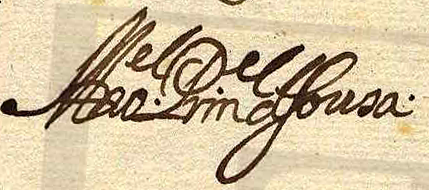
Mao.el Pimel d̄ Sousa
